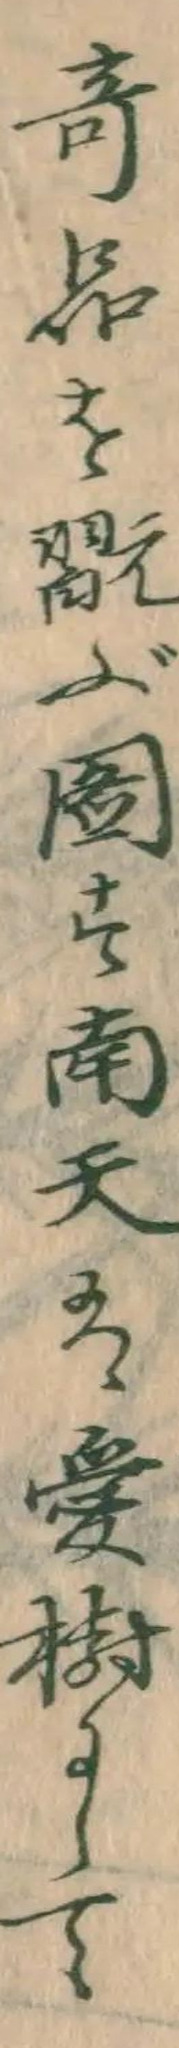奇品を翫ぶ図す南天は愛樹にして
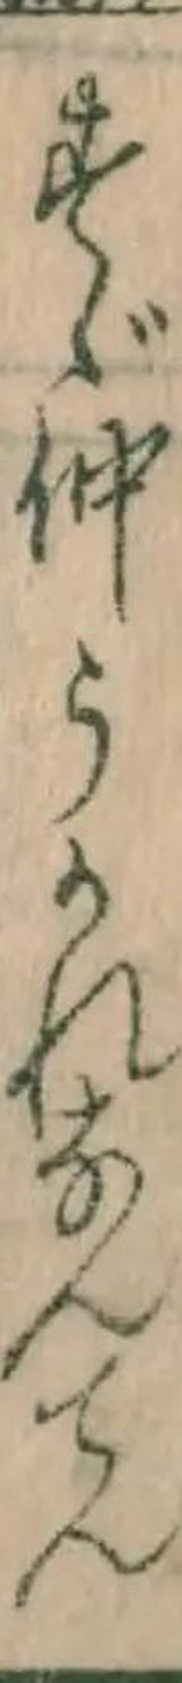すゞ仲うかれなんてん
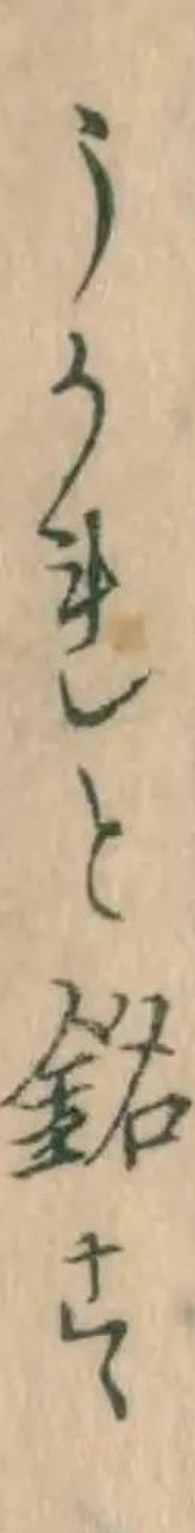うかれと銘す
